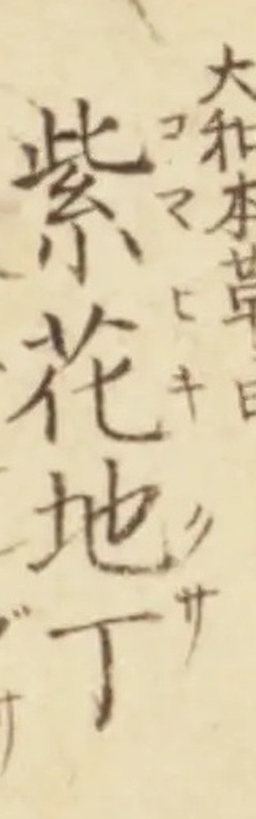紫花地丁
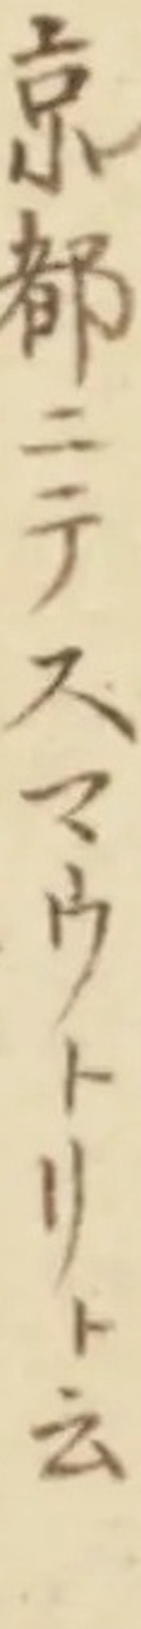京都ニテスマウトリト云
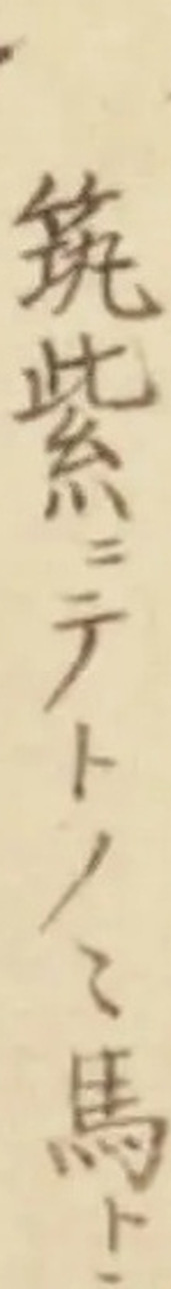筑紫ニテトノヽ馬ト云

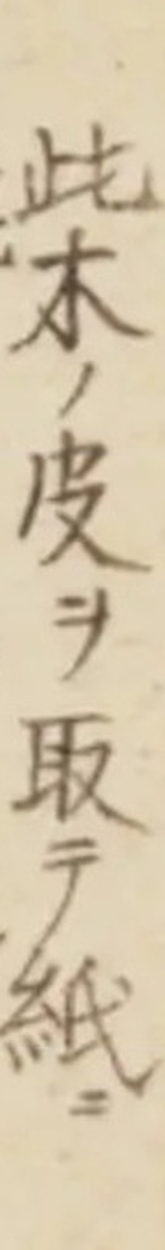此木ノ皮ヲ取テ紙ニ
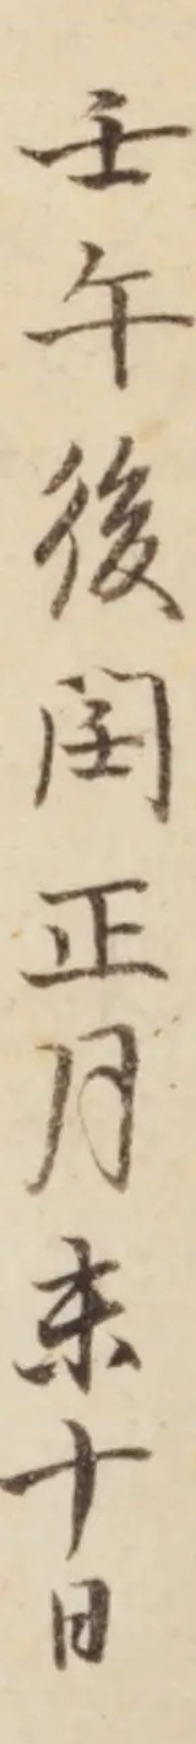壬午後閏正月末十日
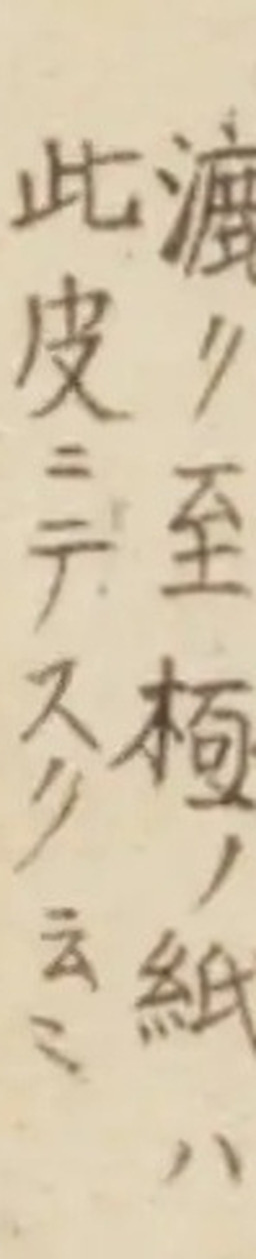此皮ニテスク云々
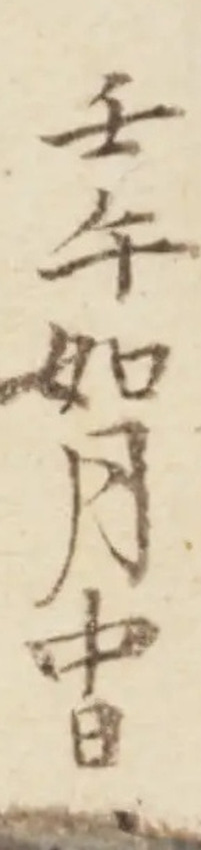壬午如月中日
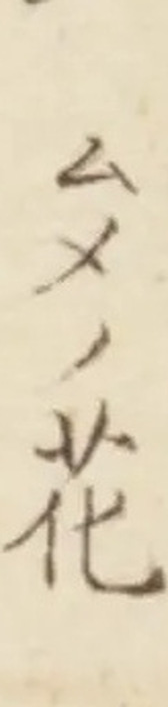ムメノ花
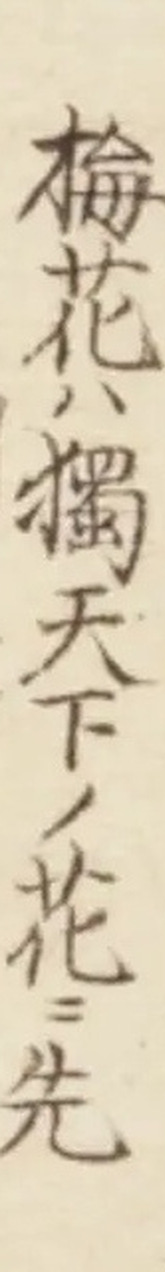梅花ハ独天下ノ花先
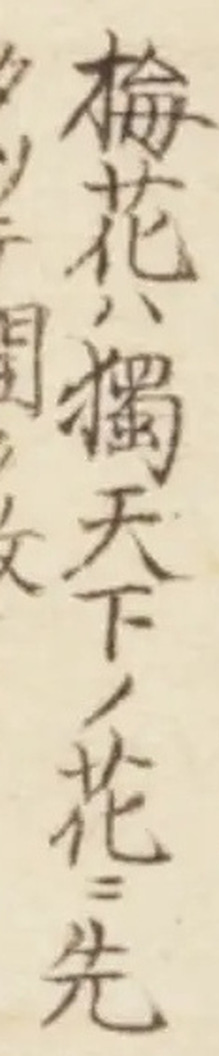梅花ハ独天下ノ花先
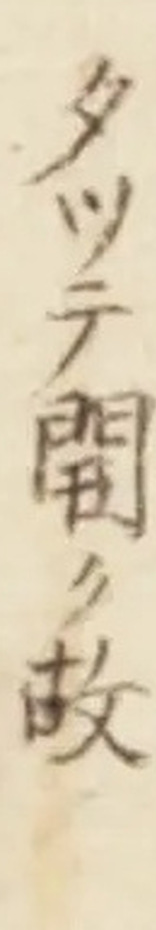タツテ開故
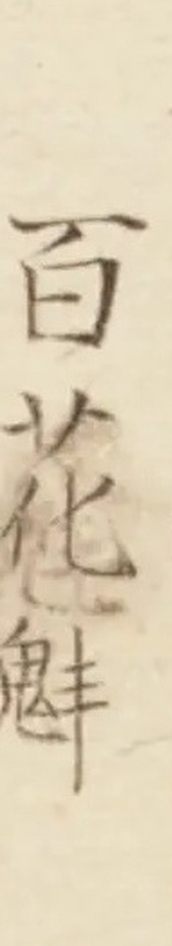百花魁
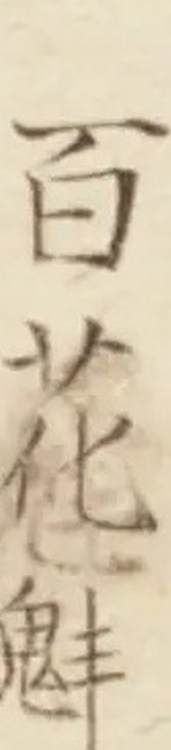百花魁
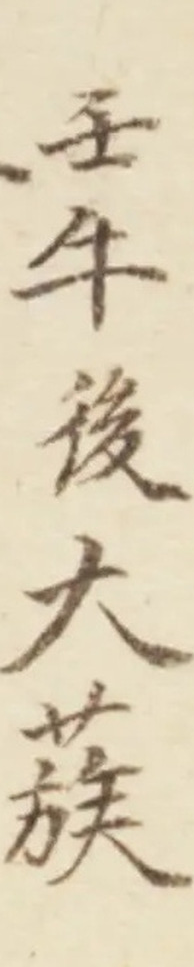壬午後大蔟

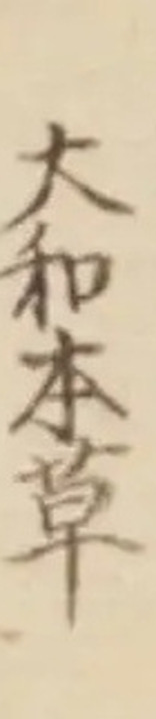大和本草
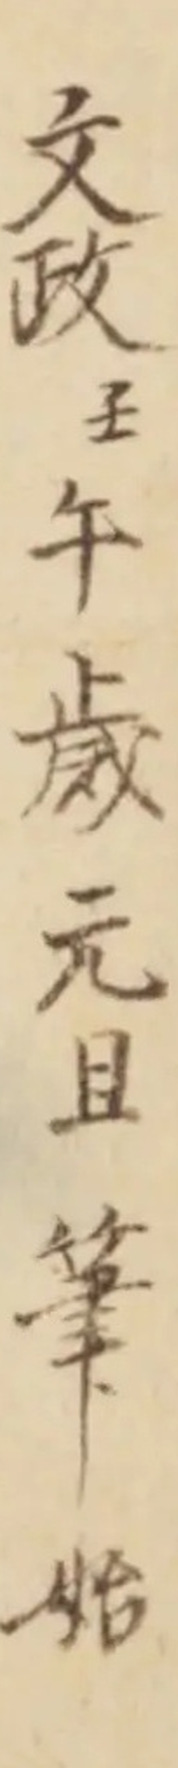文政壬午歳元日筆始
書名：梅園草木花譜春之部. 1
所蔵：国立国会図書館 National Diet Library, JAPAN
